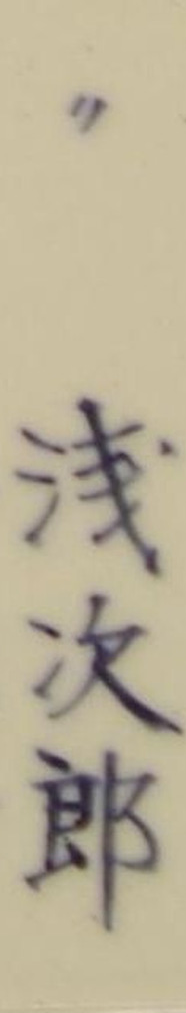茂次郎
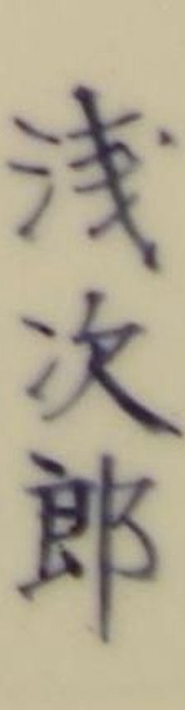茂次郎
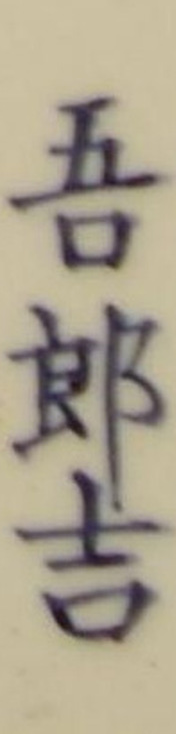吾郎吉
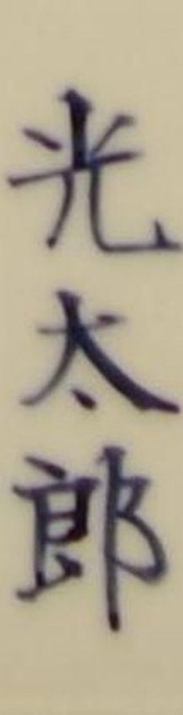光太郎
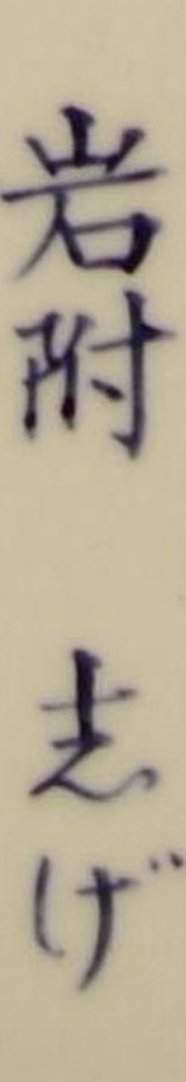岩附しげ
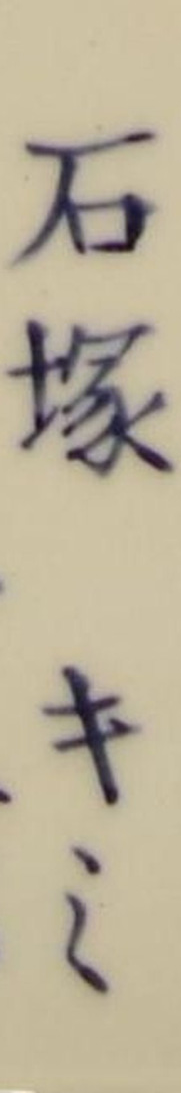石塚キミ
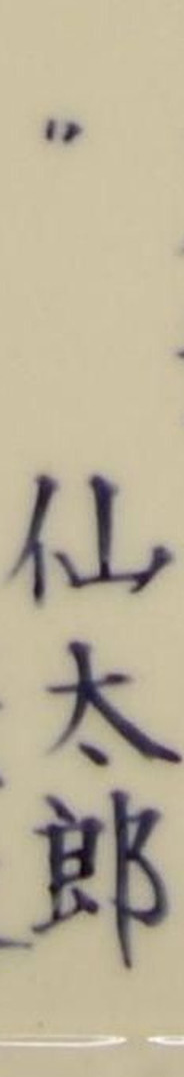仙太郎
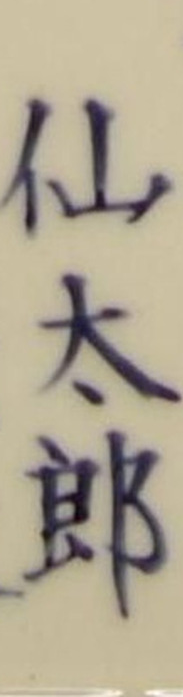仙太郎
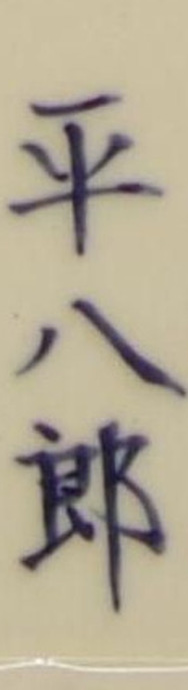平八郎
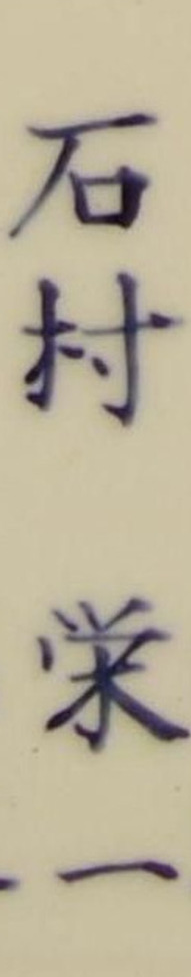石村栄一
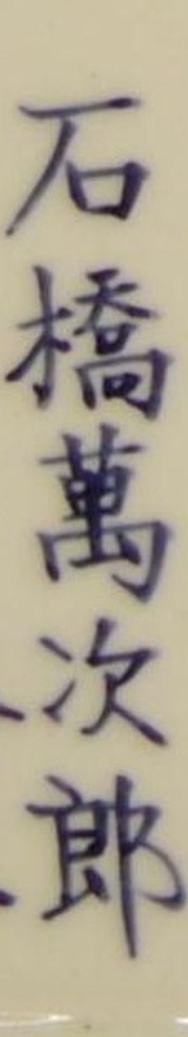石橋萬次郎
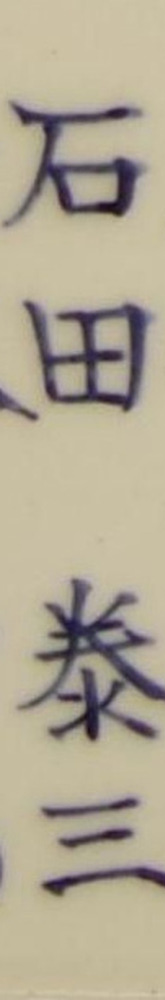石田泰三

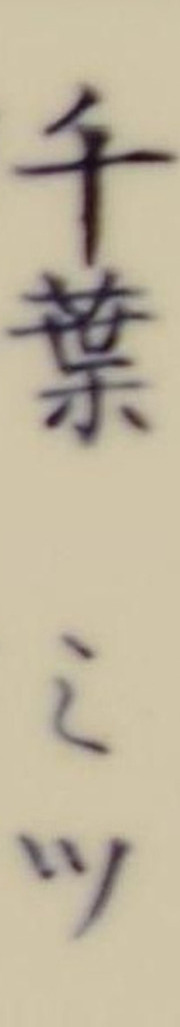千葉ミツ
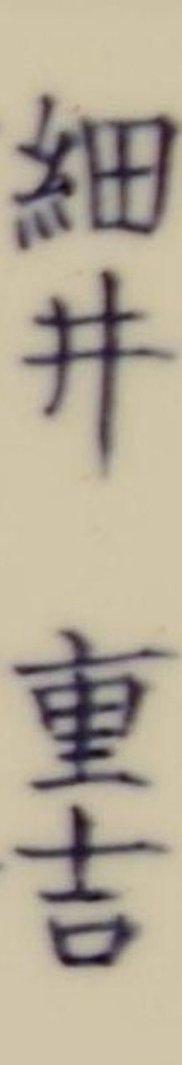細井重吉
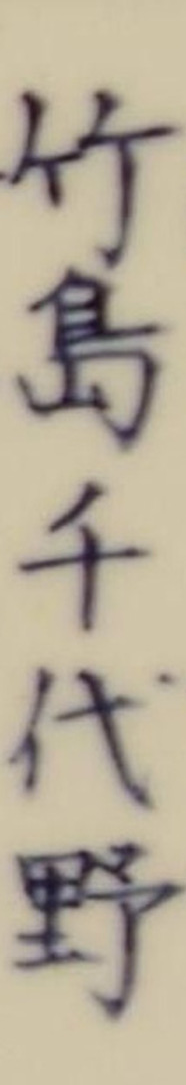竹島千代野
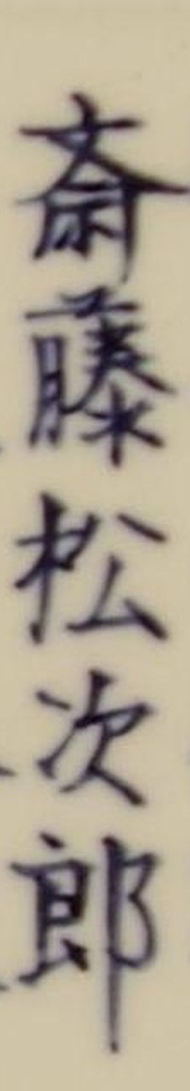斉藤松次郎
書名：E~L
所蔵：高野山金剛峯寺
